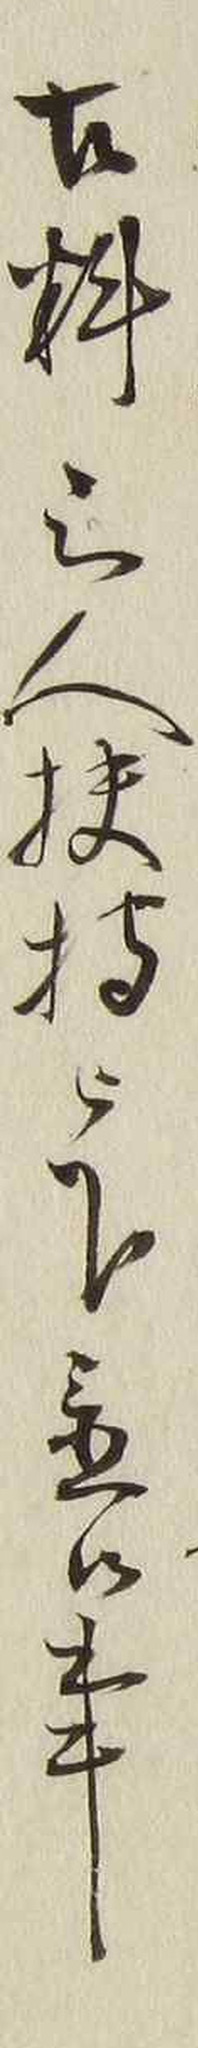古料三人扶持被下置候事

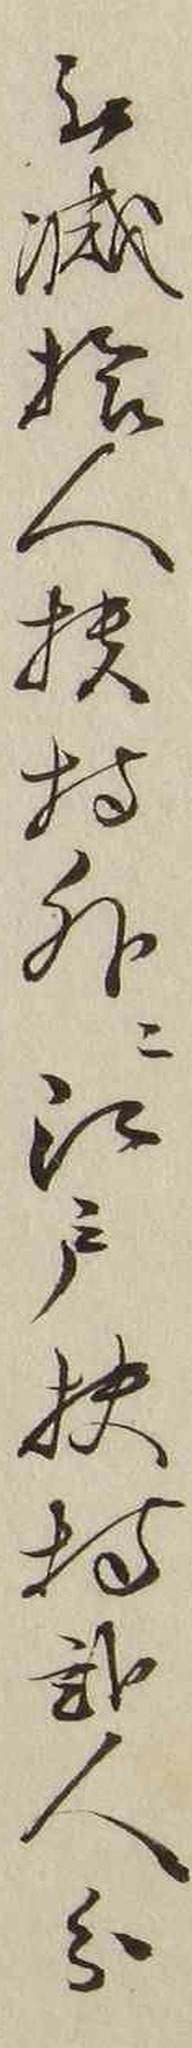被減拾人扶持外に江戸扶村弐人分
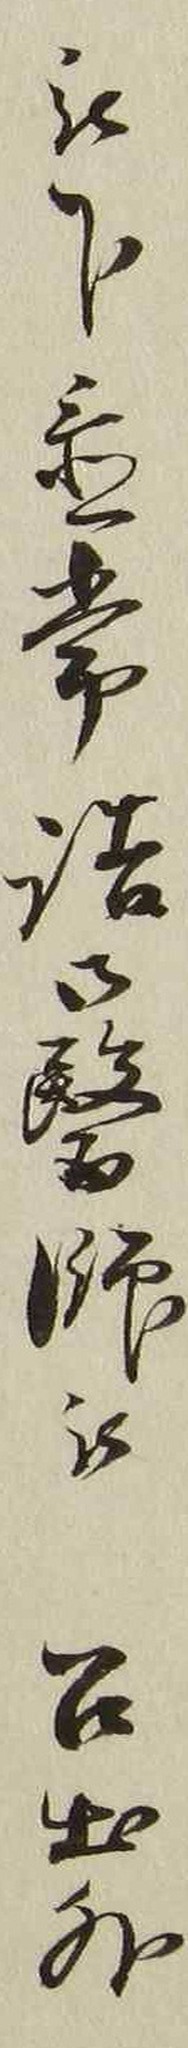被下置常詰御医師被召出外
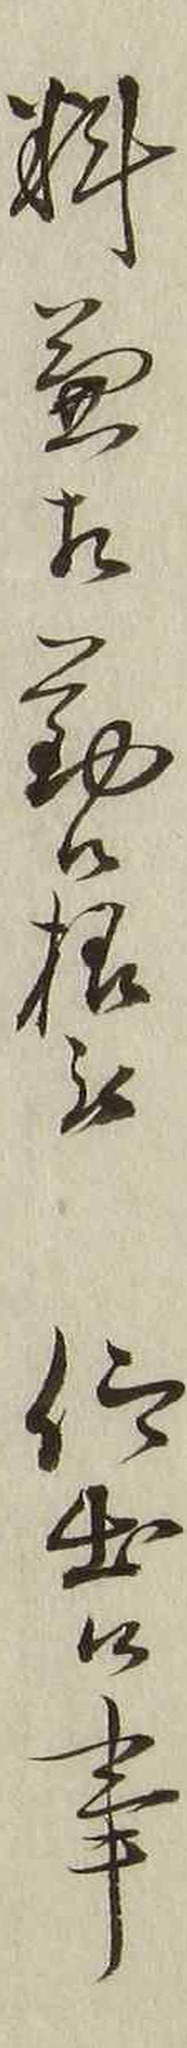料兼相勤候様被仰出候事
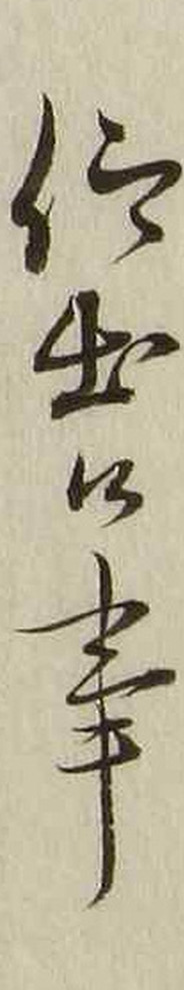仰付候事
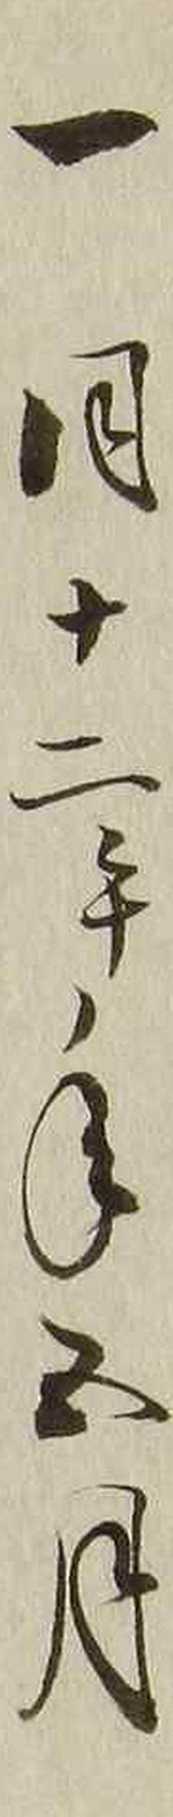一同十二午年五月
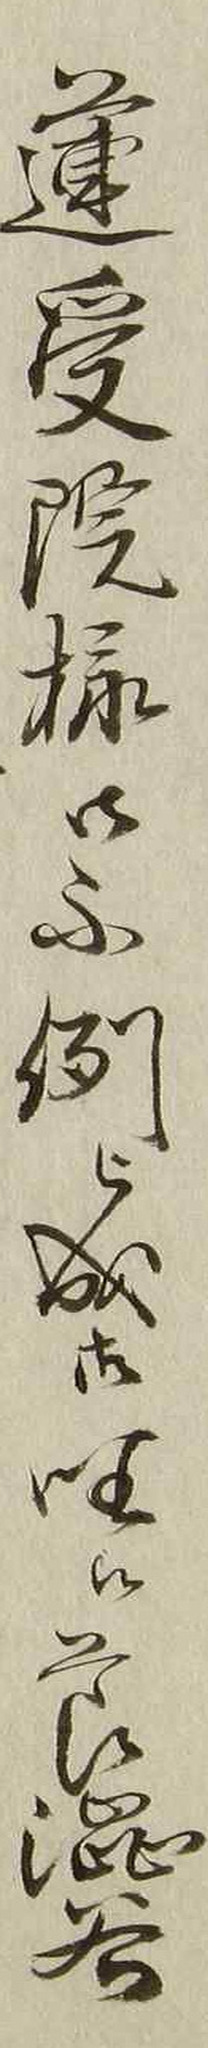蓮受院様御不例被成御坐候節渋谷
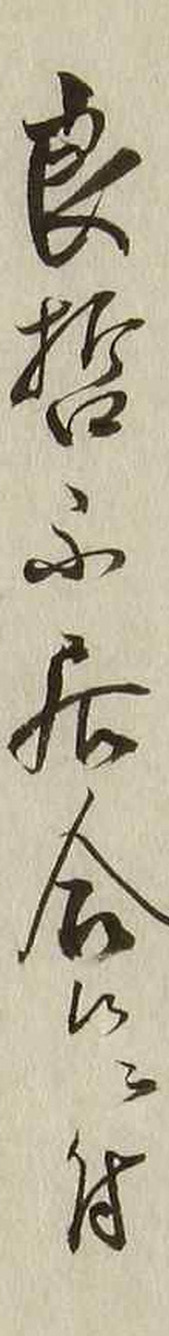良哲不居合候に付
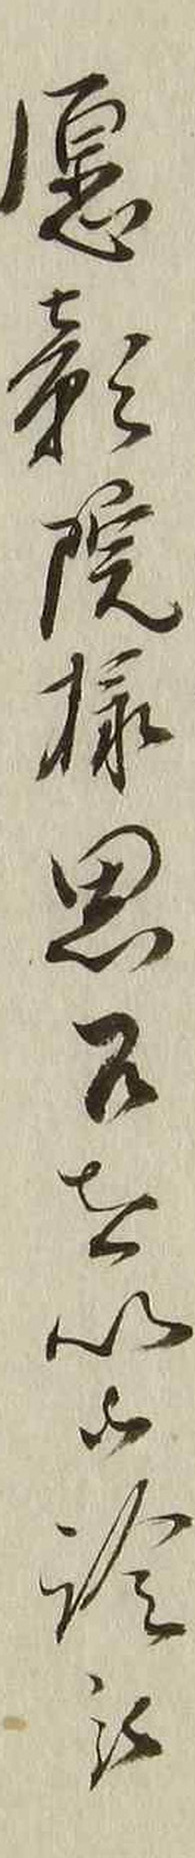愿彰院様思召を以御診被
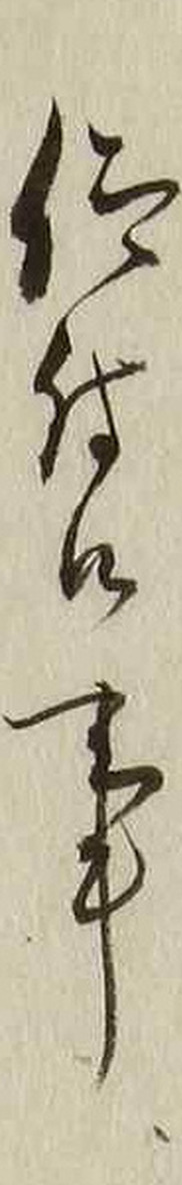仰付候事
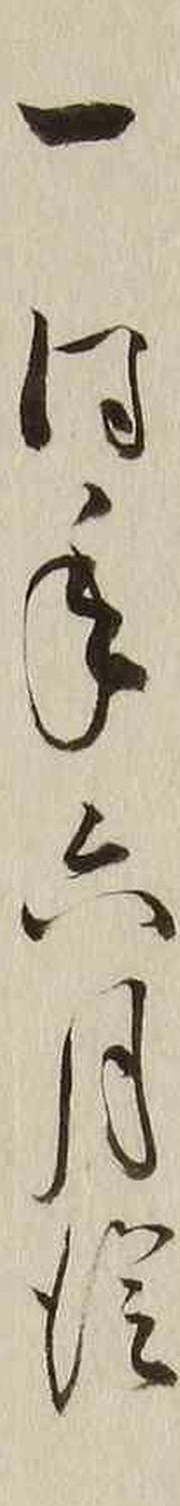一同年六月従
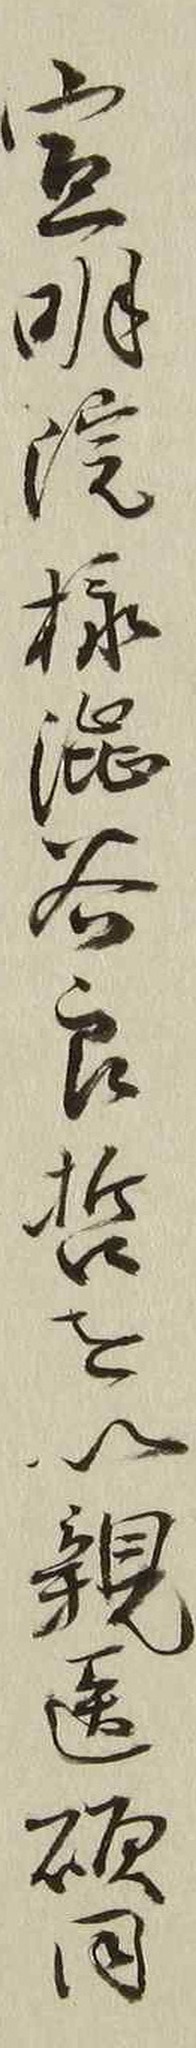宣明院様渋谷良哲を以親医碩同
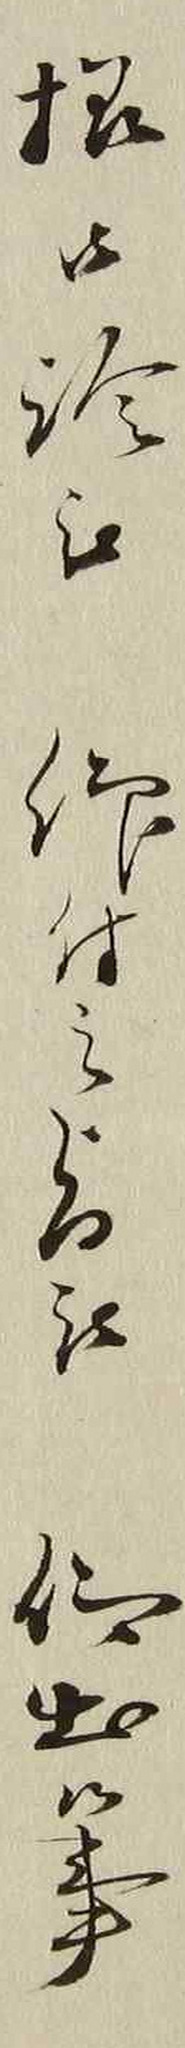様御診被仰付之旨被仰出候事
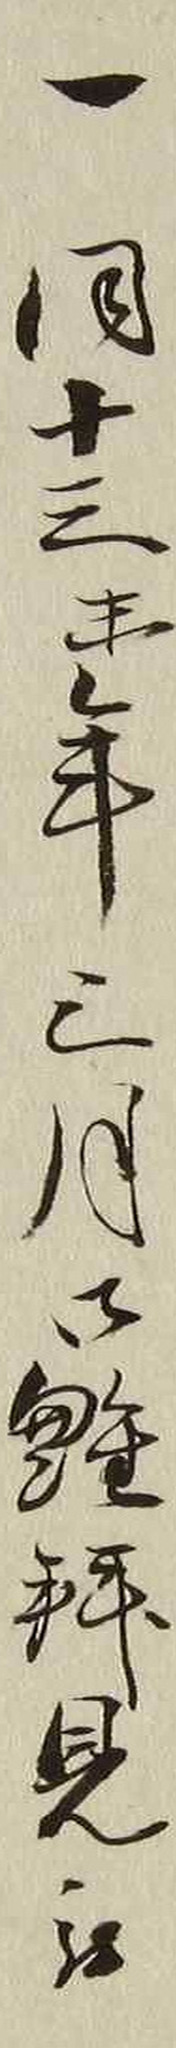一同十三未年三月御雛拝見被
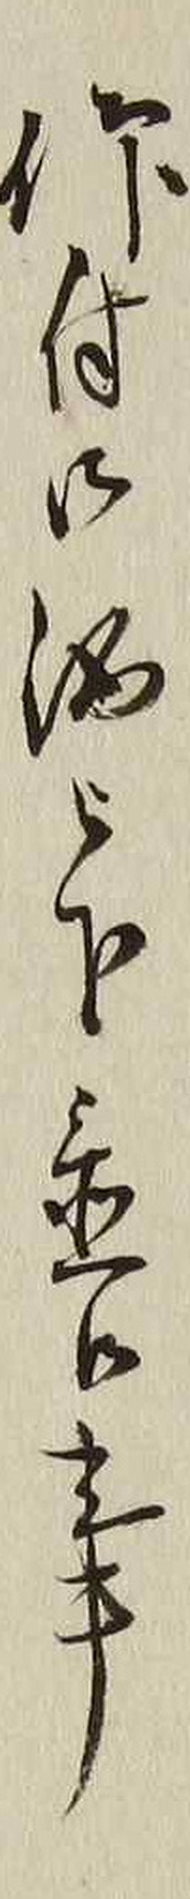仰付御酒被下置候事
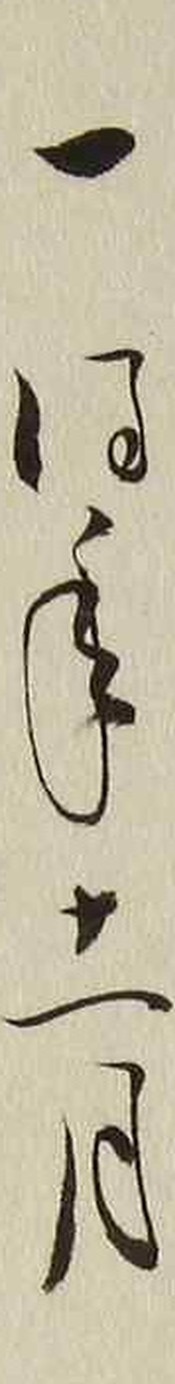一同年十一月
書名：諸士系譜　巻之157　ね之部1
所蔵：会津若松市立会津図書館
